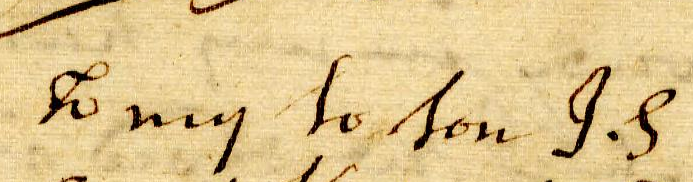To my {to} son J.S
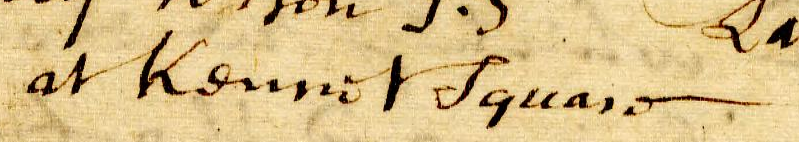at Kennet Square
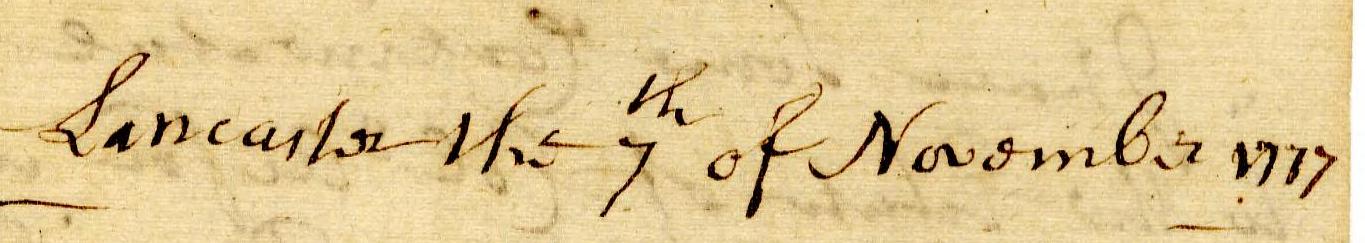Lancaster the 7^th of November 1777
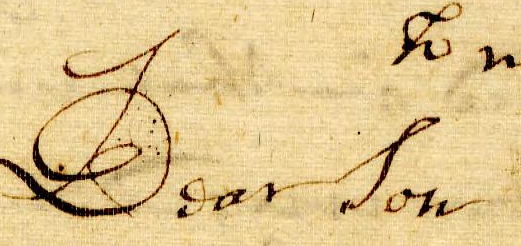Dear Son
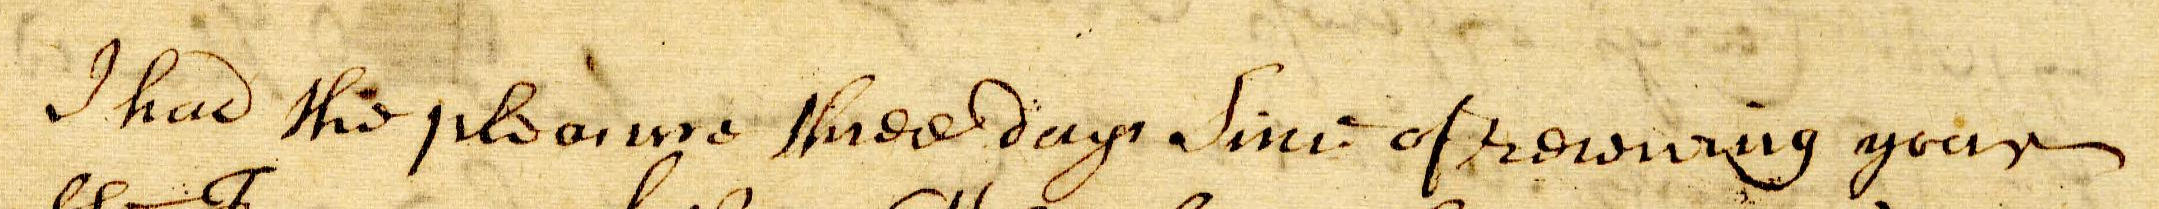I had the pleasure three days Sinc^e of receiving your
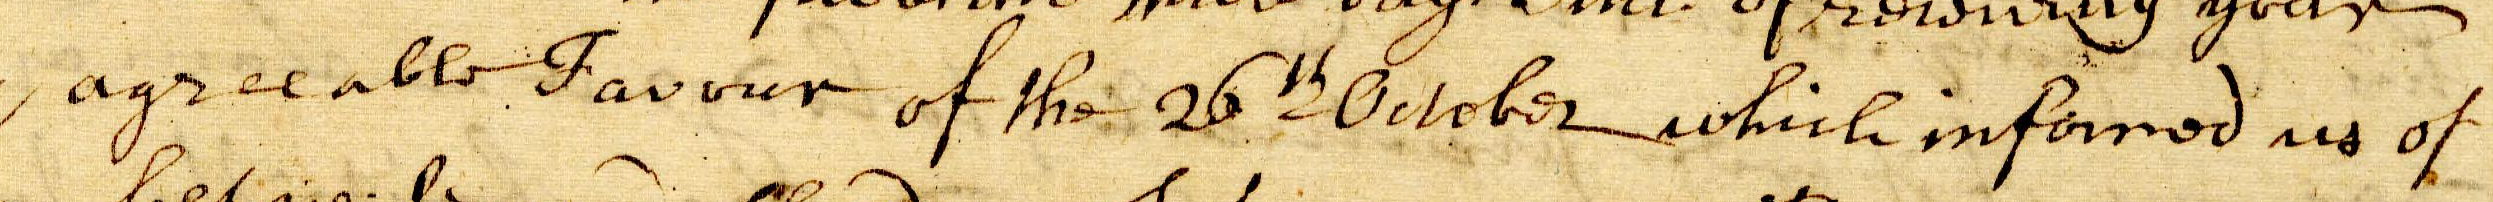agreeable Favour of the 26^th October which informed us of
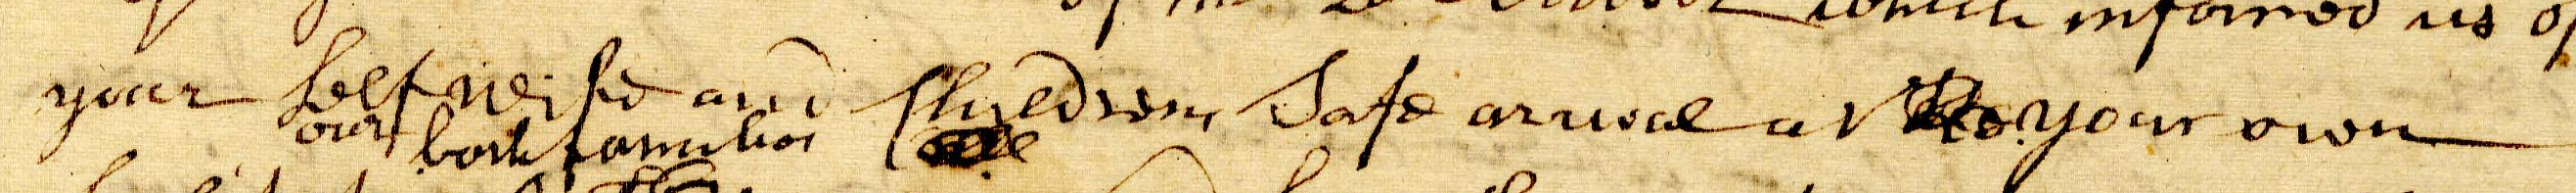your self wife and Childrens safe arrival at [___] your own
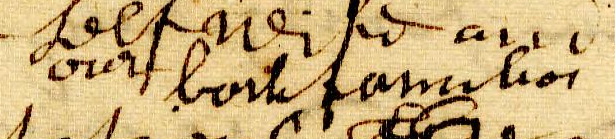over both families
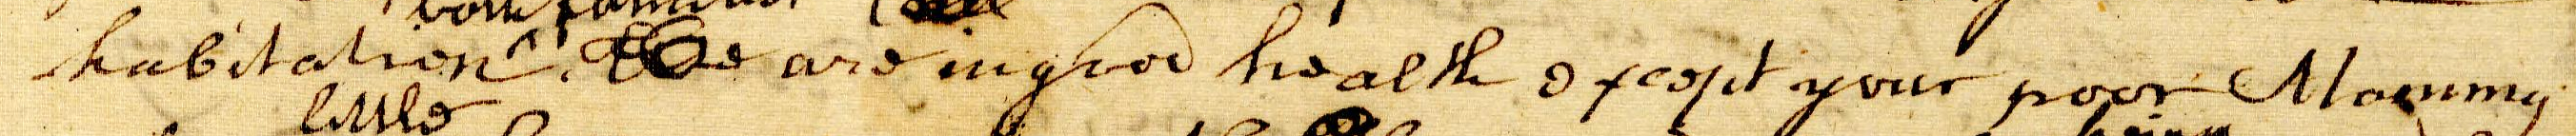habitation [___] are in good health except your poor Mammy
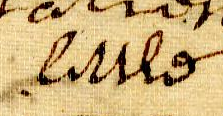little
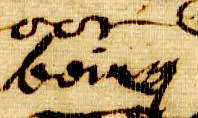being
